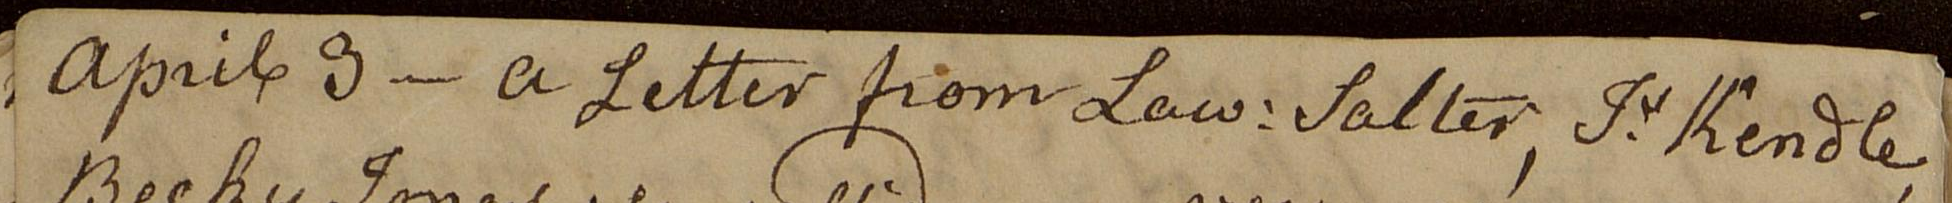April 3- A Letter from Law: Salter, J^s. Kendle,
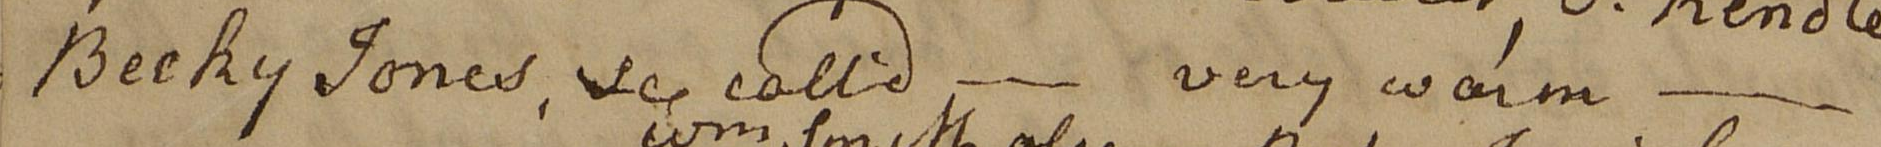Becky Jones, &c call'd- very warm-
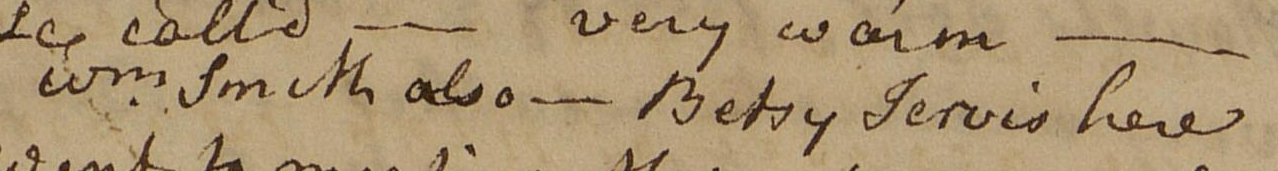W^m. Smith also- Betsy Jervis here
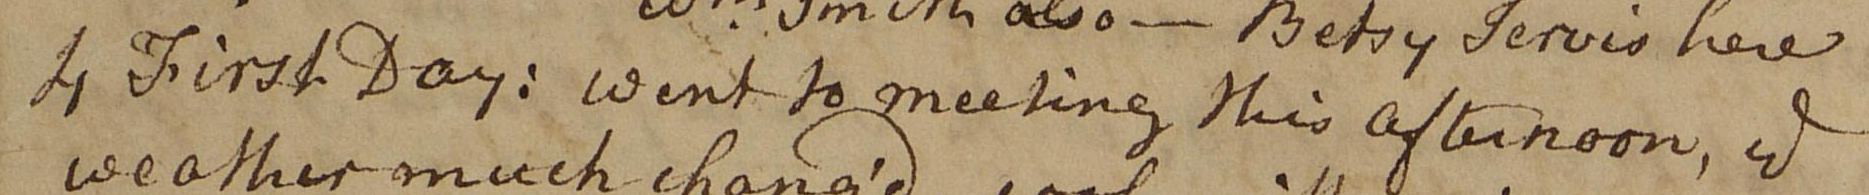4 First Day: went to meeting this afternoon, y^e
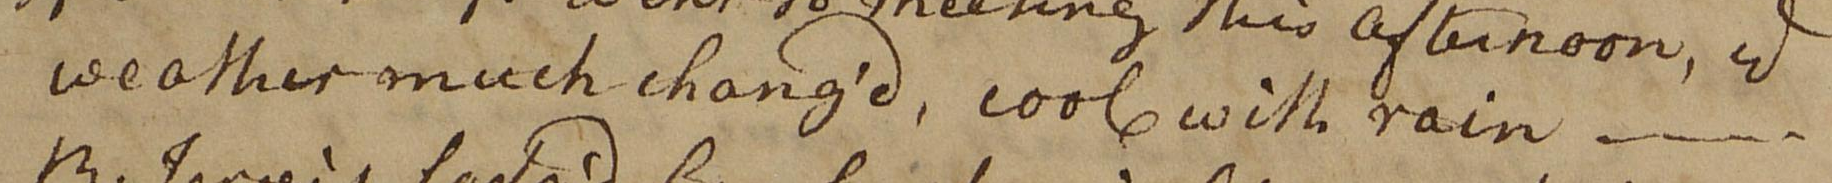weather much chang'd, cool with rain-
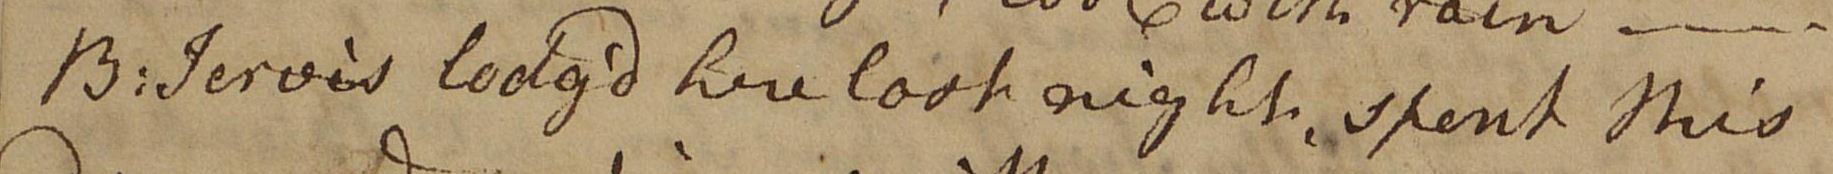B: Jervis lodg'd here last night, spent this
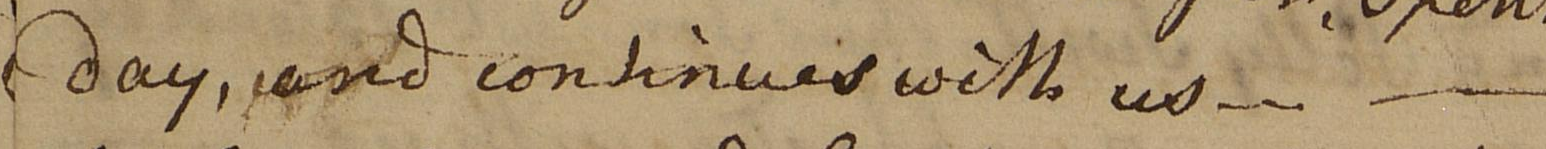day, and continues with us--
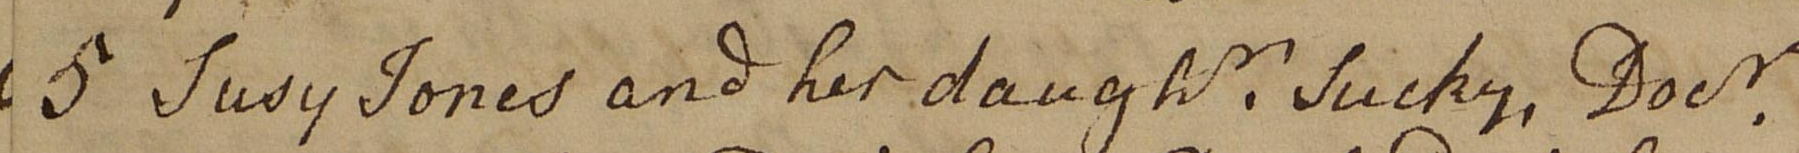5 Susy Jones and her daugh^r. Sucky, Doc^r.
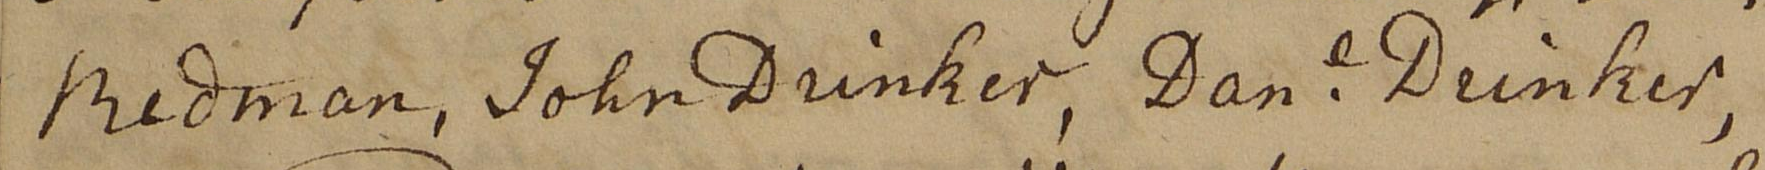Redman, John Drinker, Dan^l. Drinker,
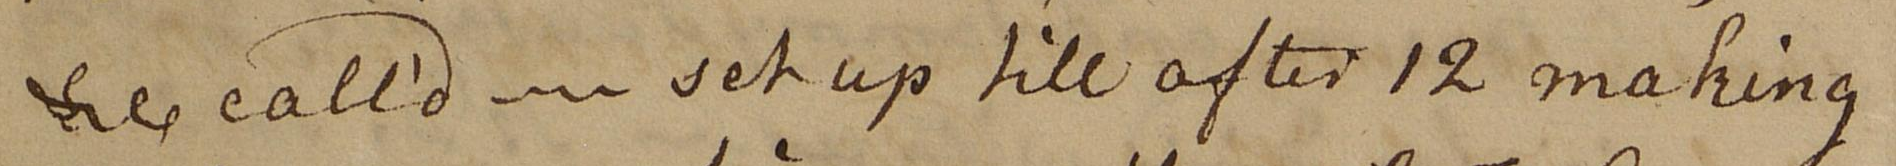&c call'd -- set up till after 12 making
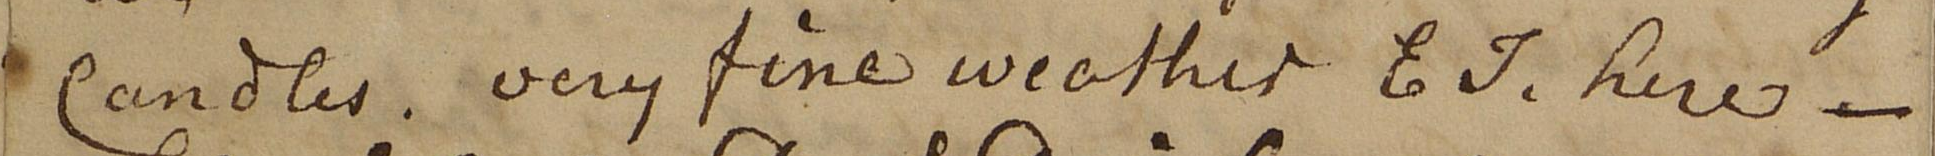Candles. very fine weather EJ. here-
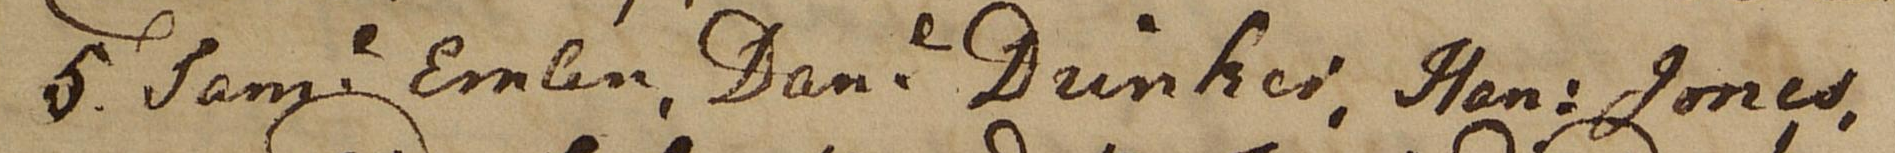5. Sam^l. Emlen, Dan^l. Drinker, Han: Jones,
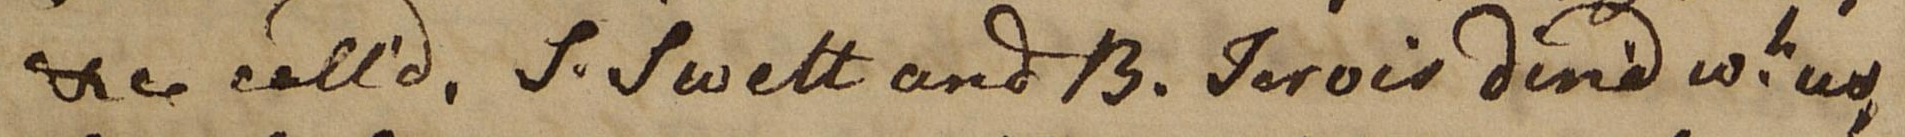&c call'd, S. Swett and B. Jervis din'd w^h us,
